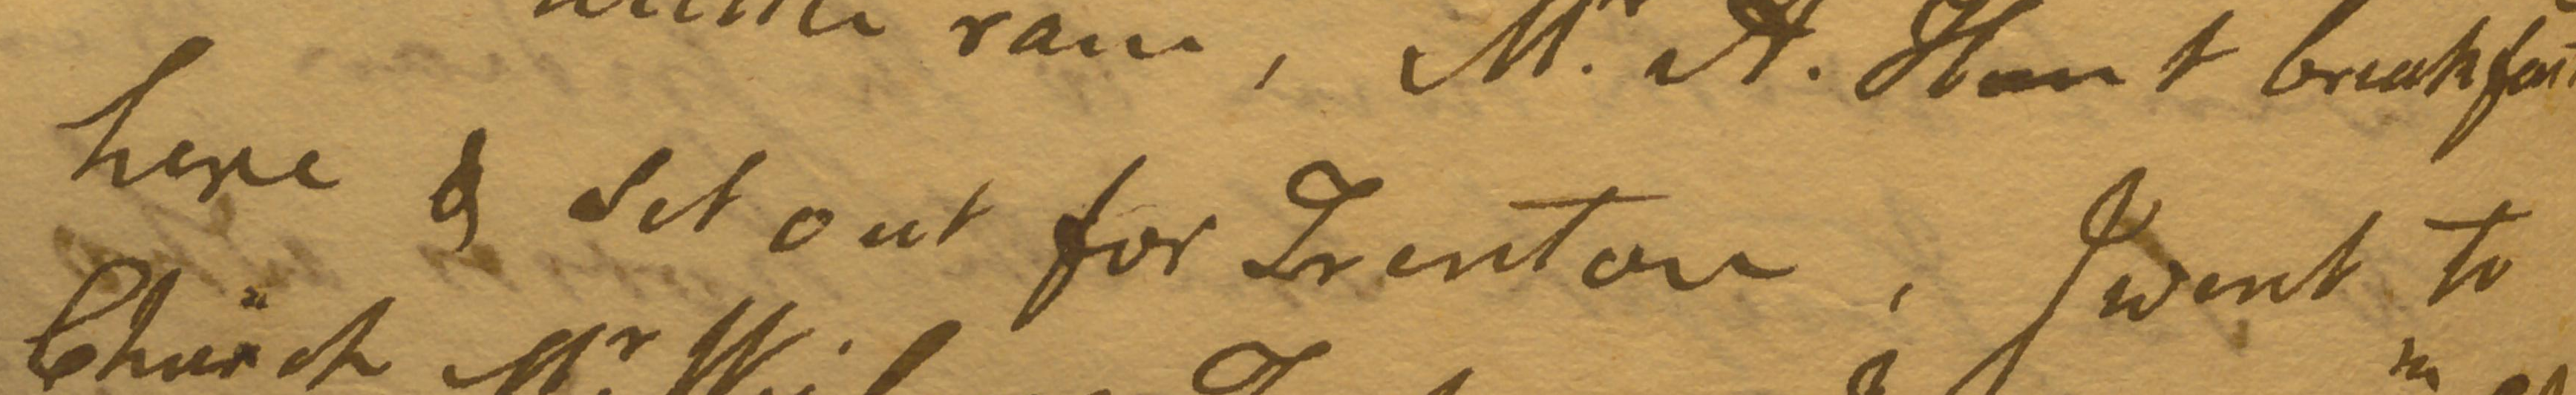here & set out for Trenton, I went to
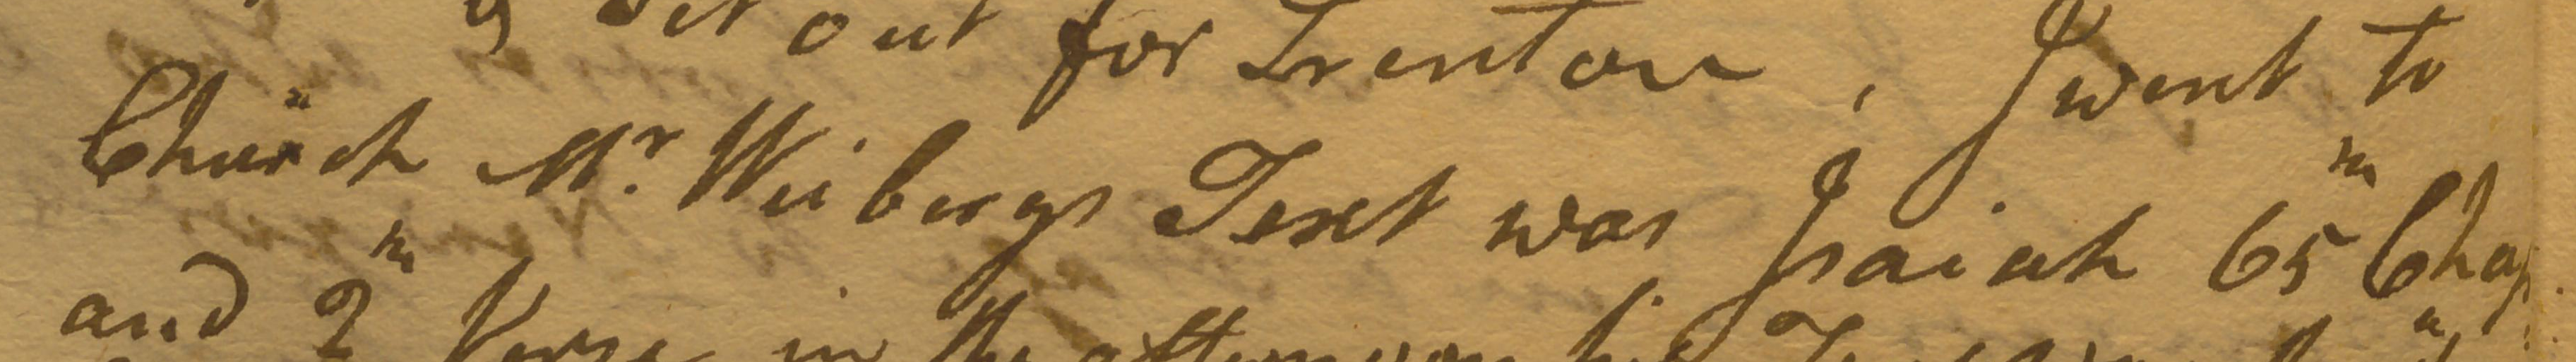Church M^r. Weibergs Text was Isaiah 65^th Chap
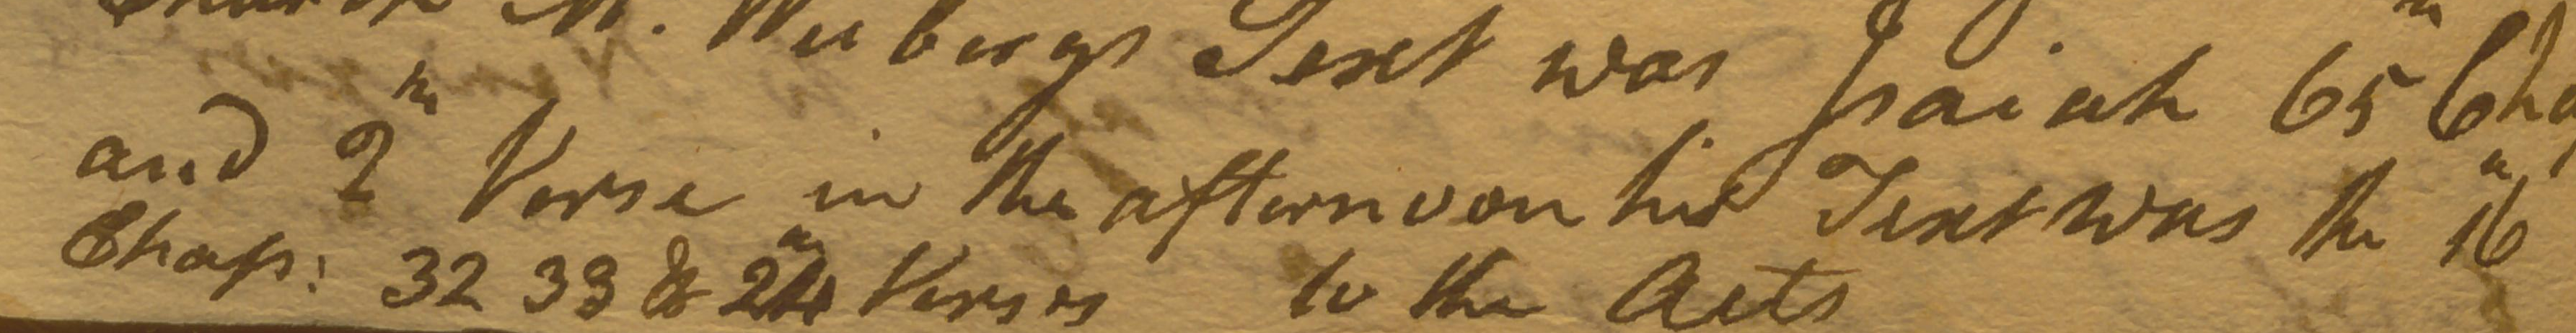and 2^th Verse in the afternoon his Text was the 16^th
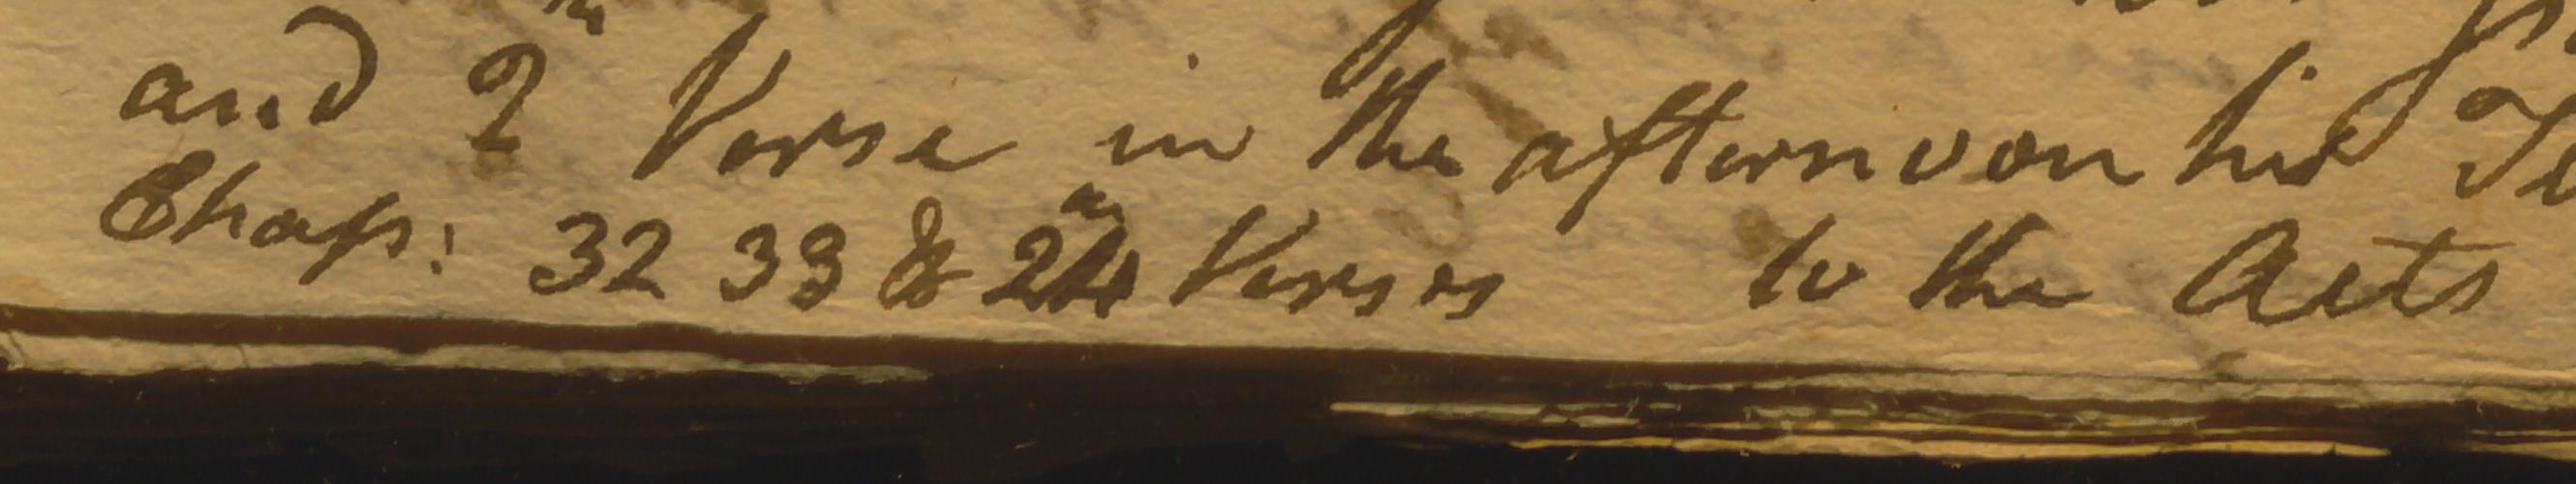Chap. 32 33 & 24^th Verses to the Acts
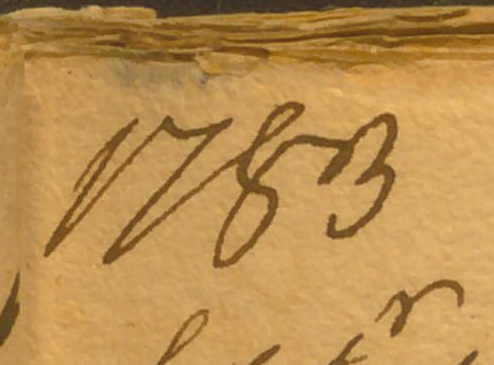1783
